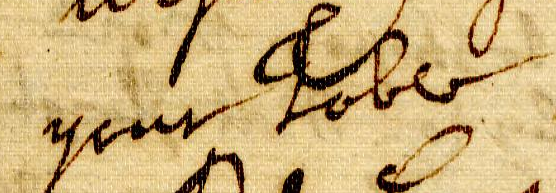your Table
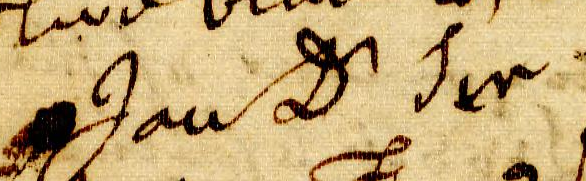I am D^r Sir
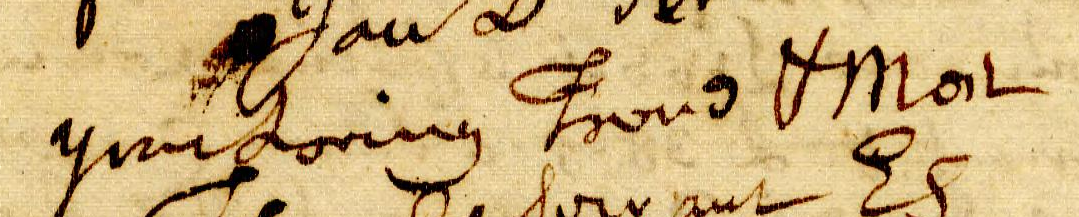Your Loving Friend & Most
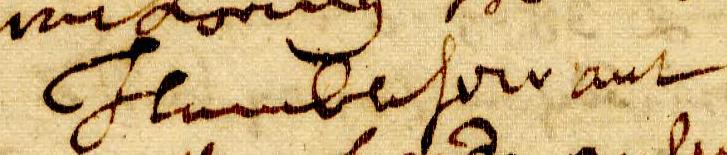Humble Servant
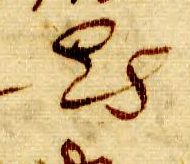ES
